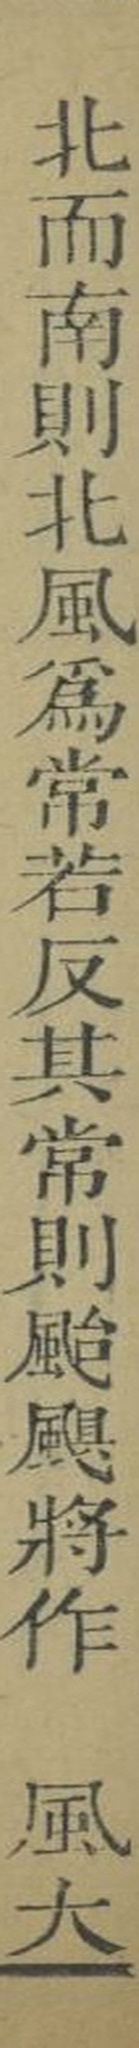北而南則北風爲常若反其常則颱颶將作風大
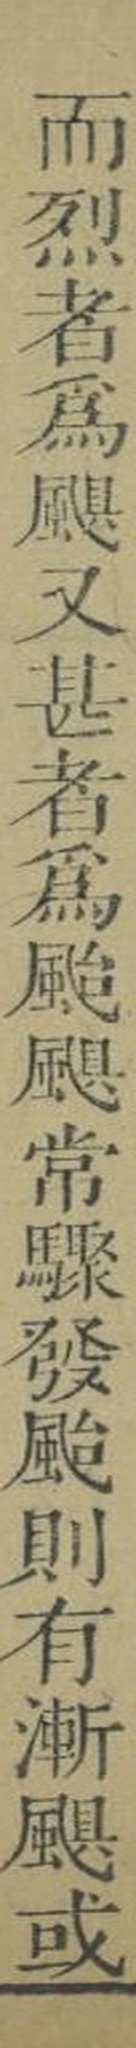而烈者爲颶又甚者爲颱颶常驟發颱則有漸颶或
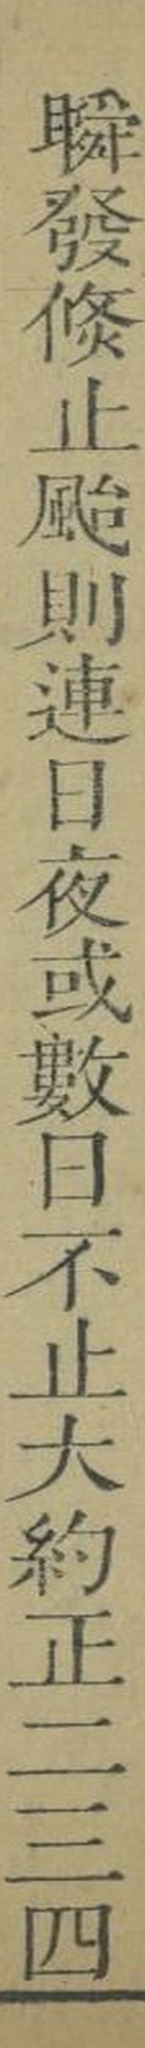瞬發焂止颱則連日夜或數日不止大約正二三四
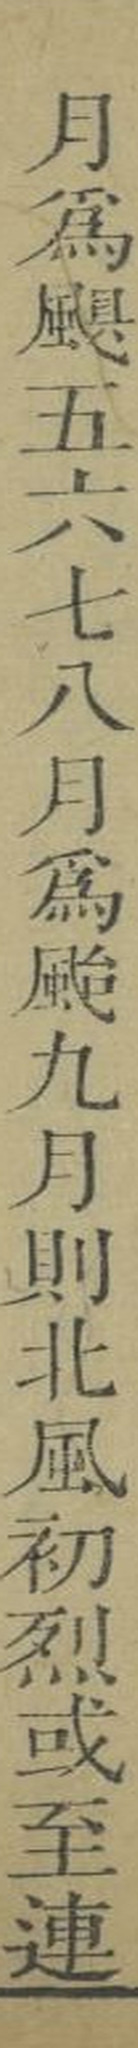月爲颶五六七八月爲颱九月則北風初烈或至連
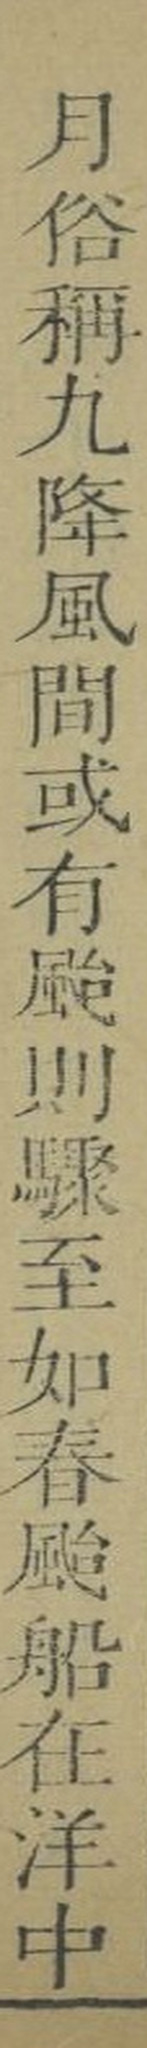月俗稱九降風間或有颱則驟至如春颱船在洋中
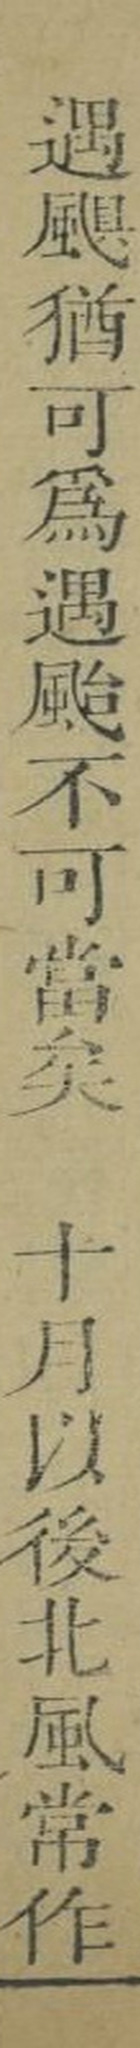遇颶猶可爲遇颱不可當矣十月以後北風常作
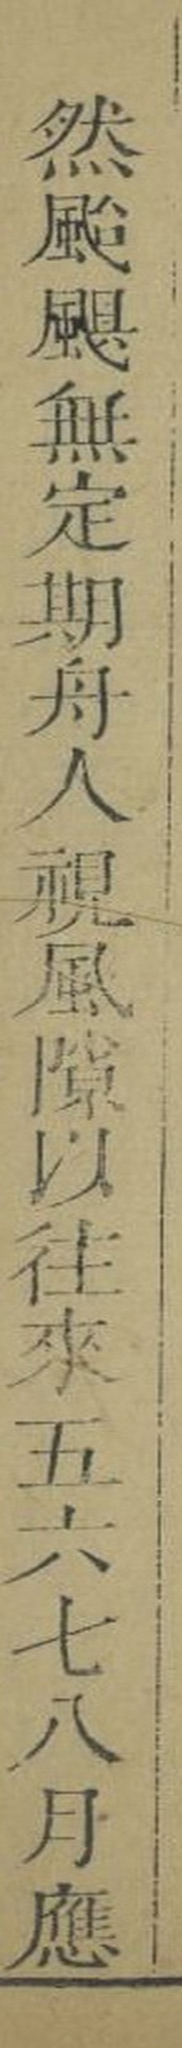然颱颶無定期舟人視風隙以往來五六七八月應
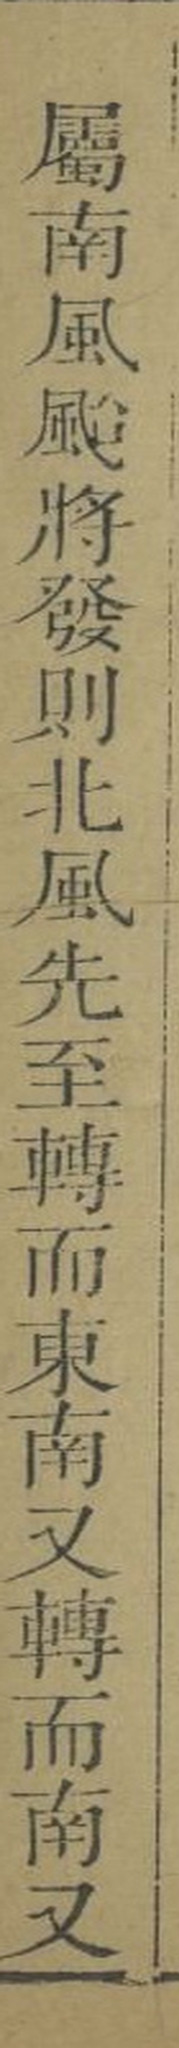屬南風颱將發則北風先至轉而東南又轉而南又

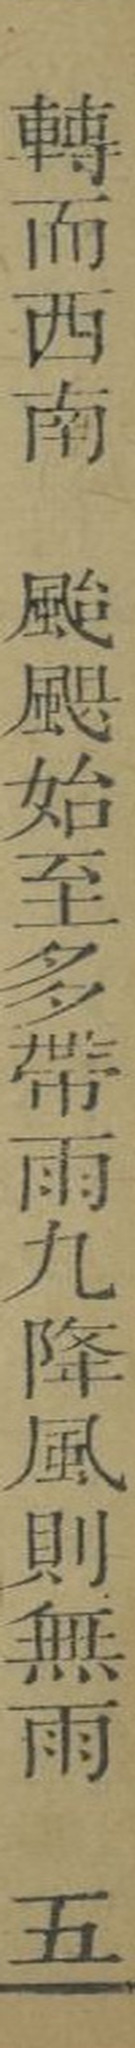轉而西南颱颶始至多帶雨九降風則無雨五
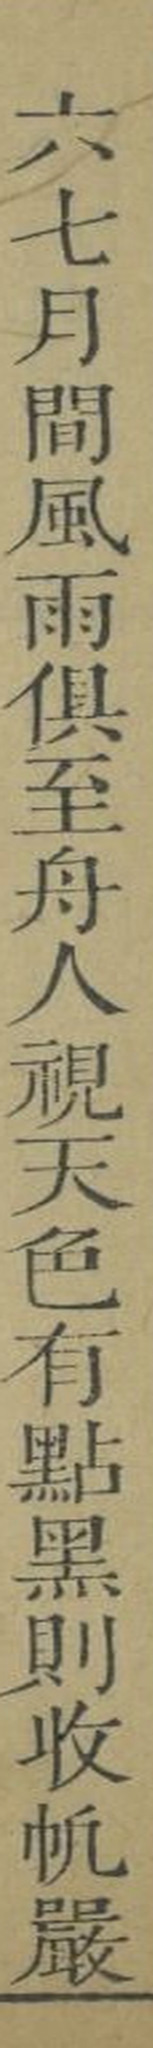六七月間風雨俱至舟人視天色有點黑則收帆嚴
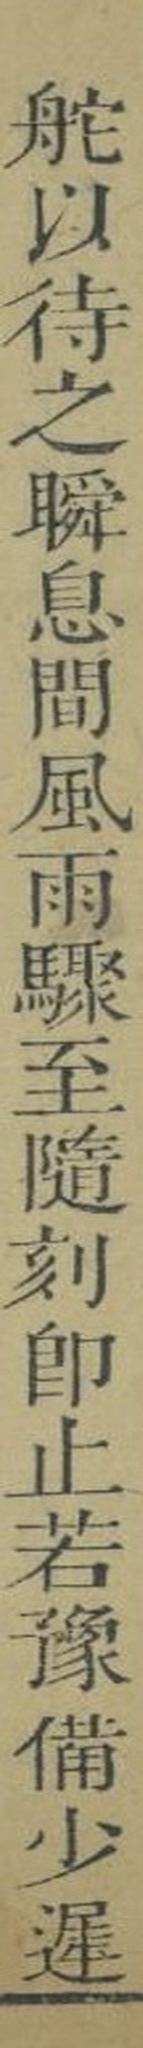舵以待之瞬息間風雨驟至隨刻卽止若豫備少遲
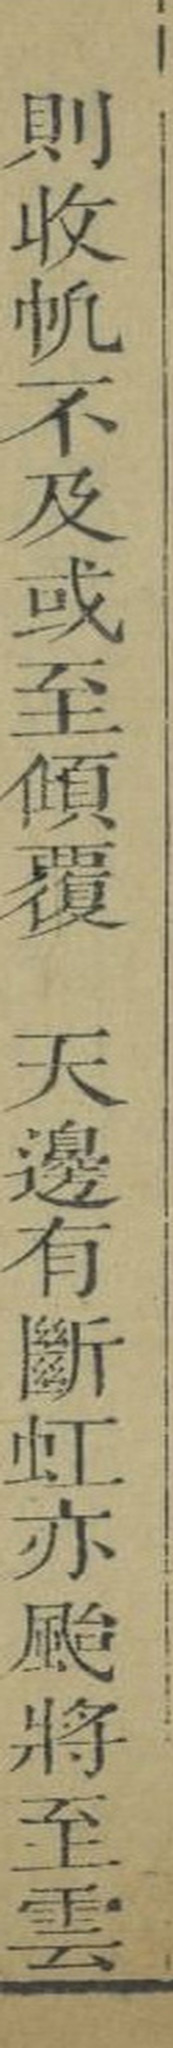則收帆不及或至傾覆天邊有斷虹亦颱將至雲
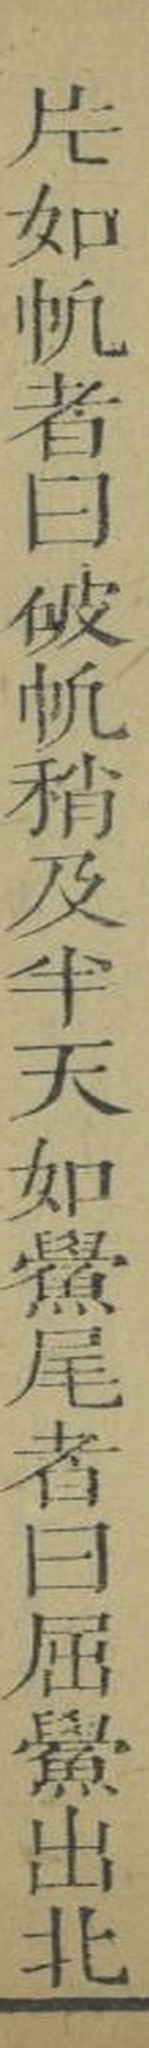片如帆者曰破帆稍及半天如鱟尾者曰屈鱟出北
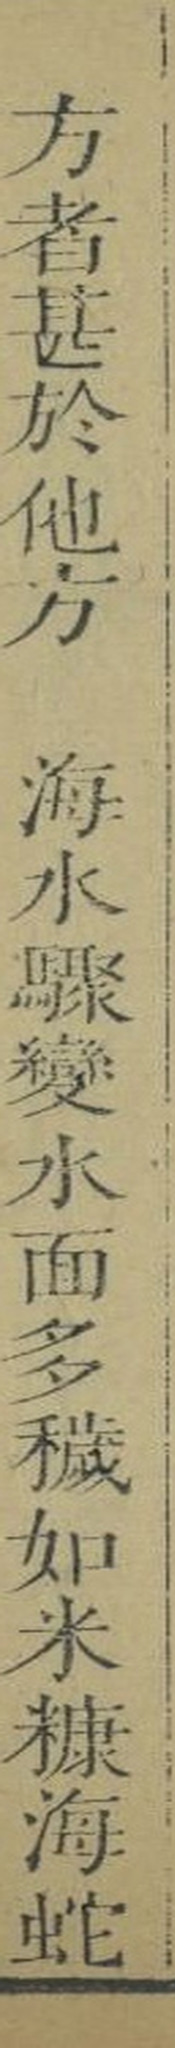方者甚於他方海水驟變水面多穢如米糠海蛇
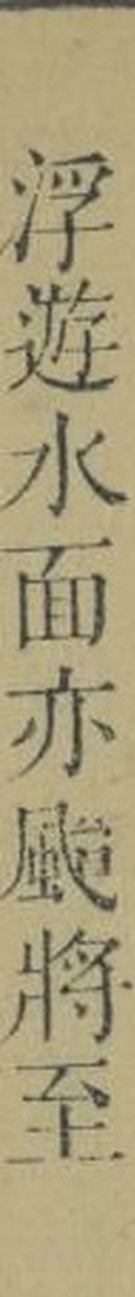浮遊水面亦颱將至
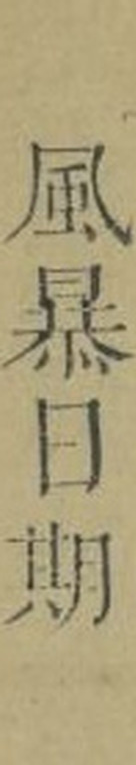風暴日期
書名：中山伝信録 巻一
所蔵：University of the Ryukyus Library
